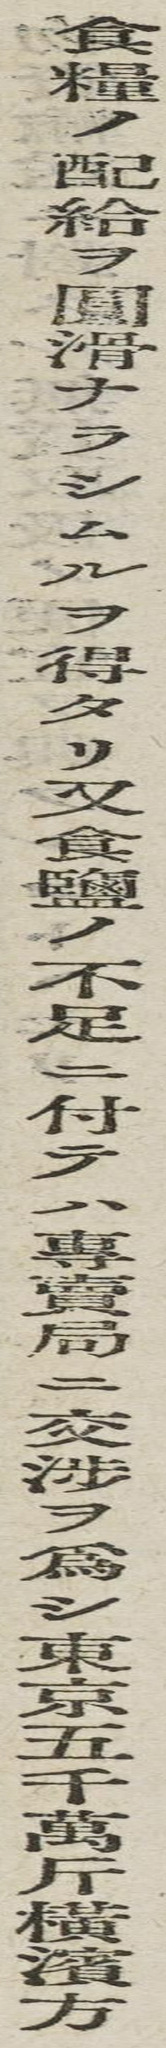食糧ノ配給ヲ円滑ナラシムルヲ得タリ又食塩ノ不足ニ付テハ専売局ニ交渉ヲ為シ東京五千万斤横浜方
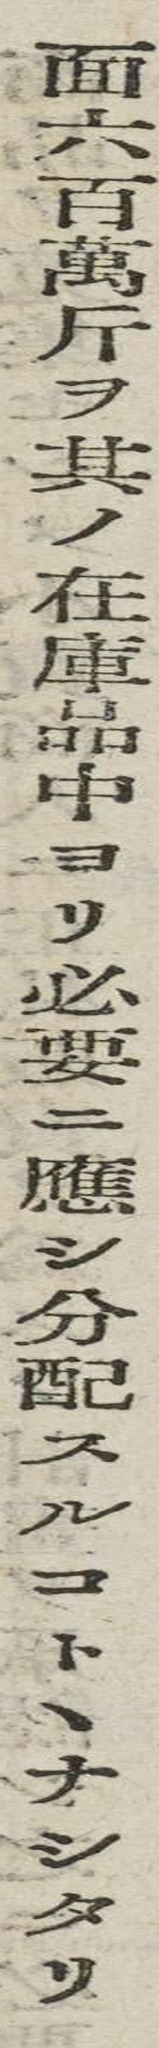面六百万斤ヲ其ノ在庫品中ヨリ必要ニ応シ分配スルコトヽシタリ
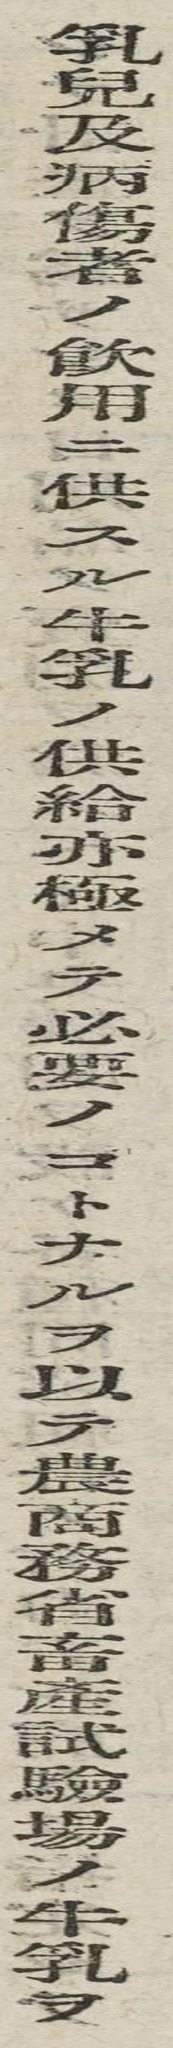乳児及病傷者ノ飲用ニ供スル牛乳ノ供給亦極メテ必要ノコトナルヲ以テ農商務省畜産試験場ノ牛乳ヲ
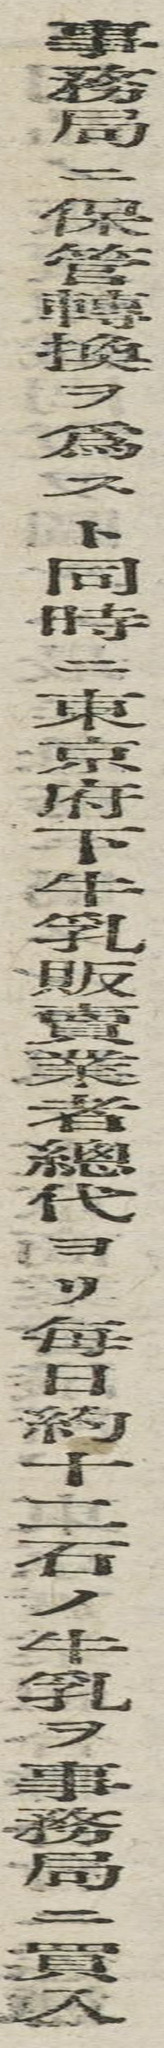事務局ニ保管転換ヲ為スト同時ニ東京府下牛乳販売業者総代ヨリ毎日約十二石ノ牛乳ヲ事務局ニ買入
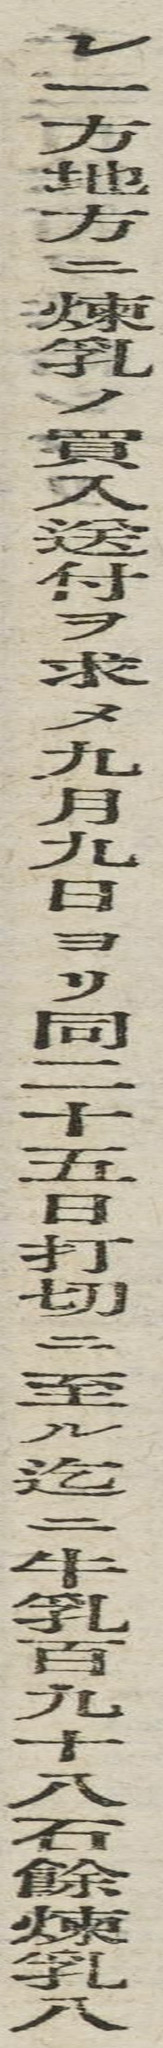レ一方地方ニ煉乳ノ買入送付ヲ求メ九月九日ヨリ同二十五日打切ニ至ル迄ニ牛乳百九十八石余煉乳八

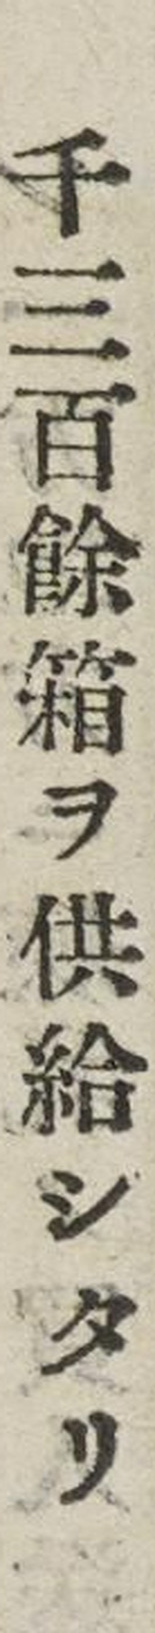千三百余箱ヲ供給シタリ
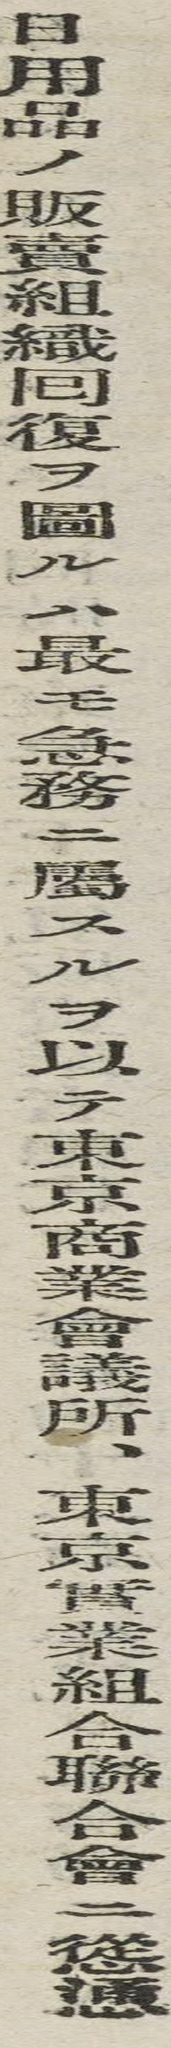日用品ノ販売組織回復ヲ図ルハ最モ急務ニ属スルヲ以テ東京商業会議所、東京実業組合連合会ニ慫慂
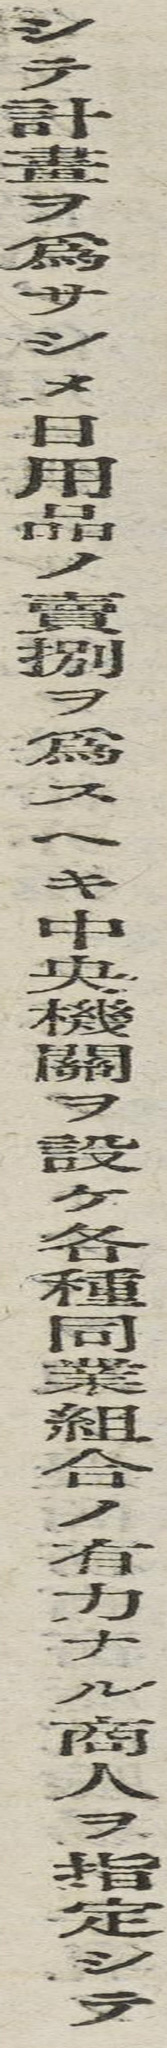シテ計画ヲ為サシメ日用品ノ売捌ヲ為スヘキ中央機関ヲ設ケ各種同業組合ノ有力ナル商人ヲ指定シテ
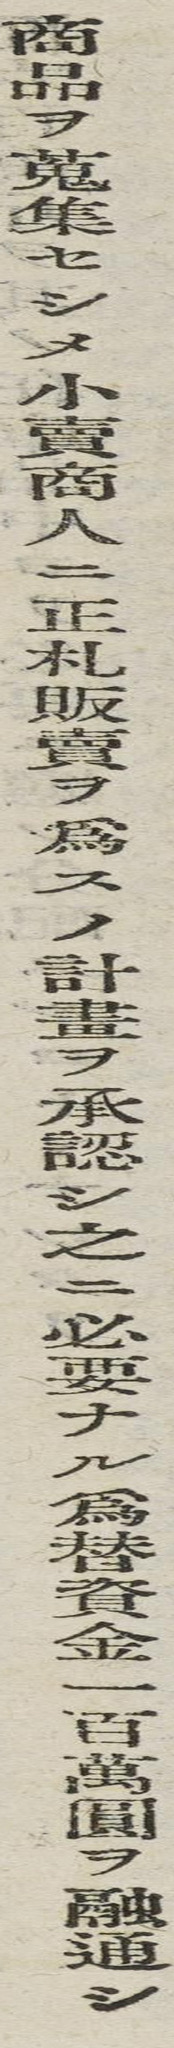商品ヲ蒐集セシメ小売商人ニ正札販売ヲ為スノ計画ヲ承認シ之ニ必要ナル為替資金一百万円ヲ融通シ
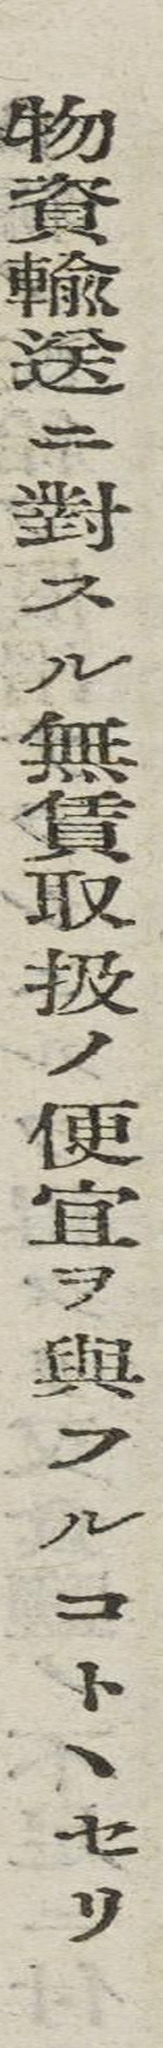物資輸送ニ対スル無賃取扱ノ便宜ヲ与フルコトヽセリ
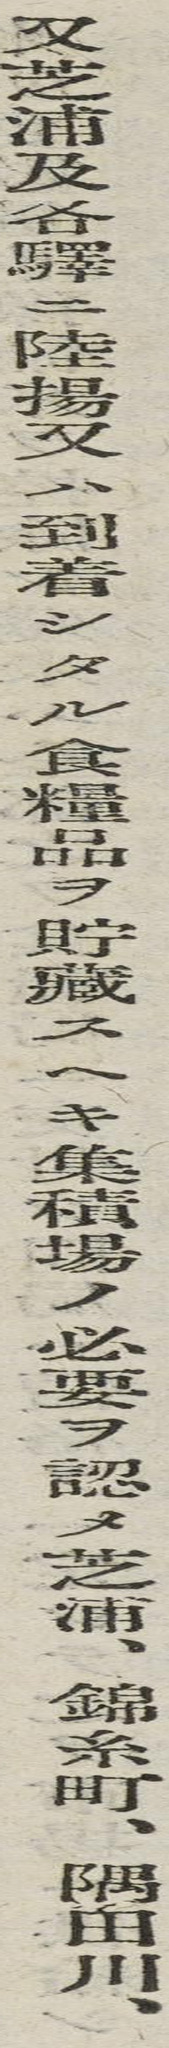又芝浦及各駅ニ陸揚又ハ到着シタル食糧品ヲ貯蔵スヘキ集積場ノ必要ヲ認メ芝浦、錦糸町、隅田川、
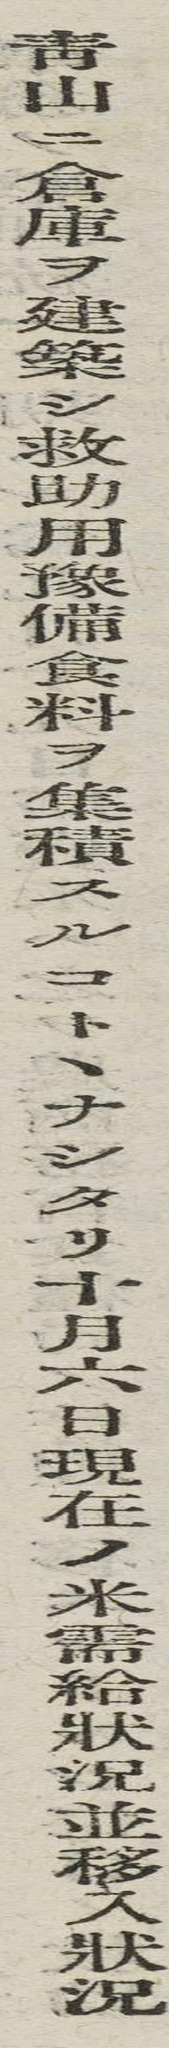青山ニ倉庫ヲ建築シ救助用予備食料ヲ集積スルコトヽナシタリ十月六日現在ノ米需給状況並移入状況
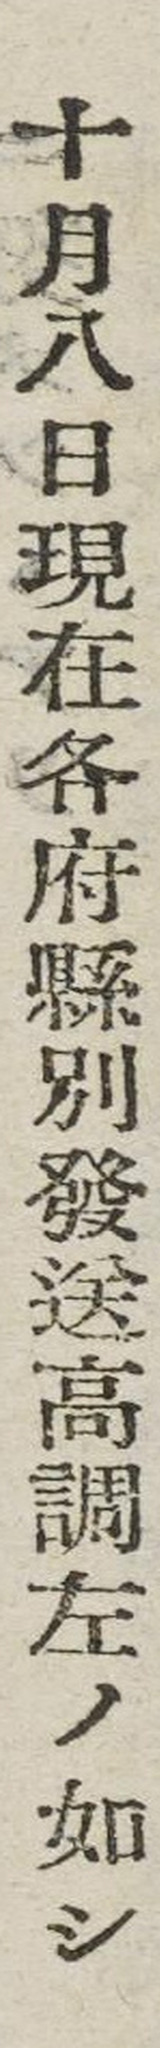十月八日現在各府県別発送高調左ノ如シ
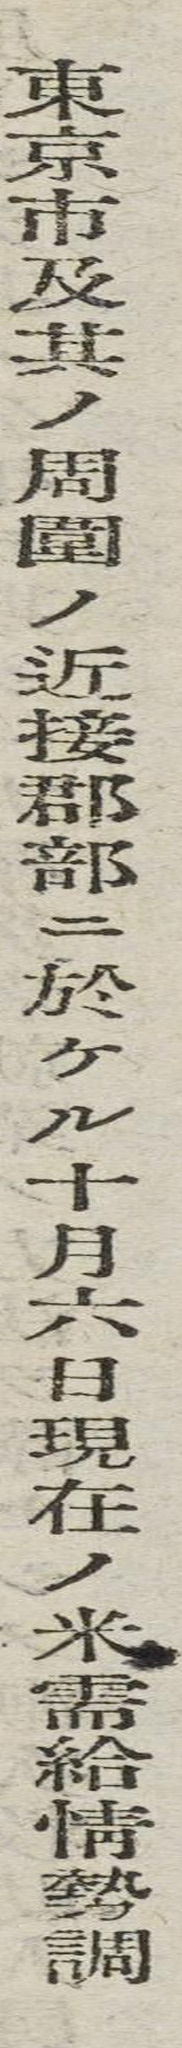東京市及其ノ周囲ノ近接郡部ニ於ケル十月六日現在ノ米需給情勢調
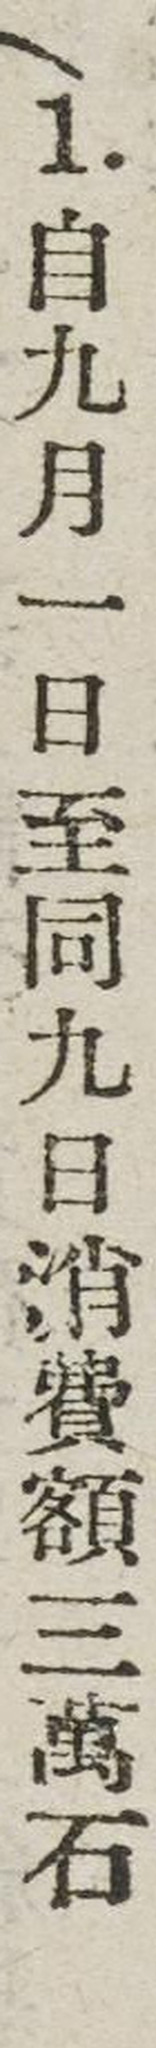⒈自九月一日至同九日消費額三万石
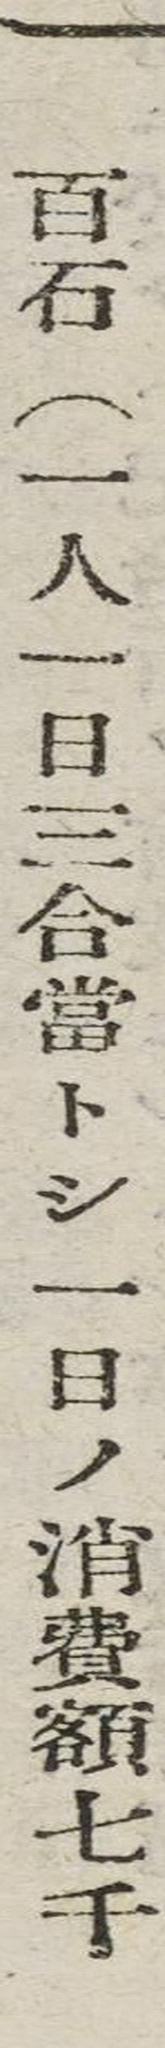百石（一人一日三合当トシ一日ノ消費額六千
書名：震災被害状況並救護施設概要
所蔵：東京大学地震研究所図書室 Earthquake Research Institute Library, The University of Tokyo, JAPAN
